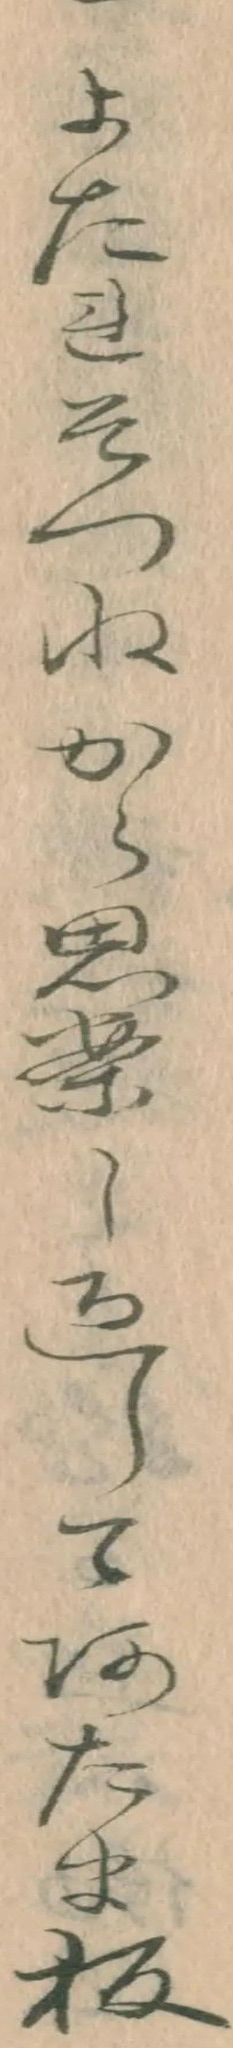一与他連そつねから思案し過して阿たま板
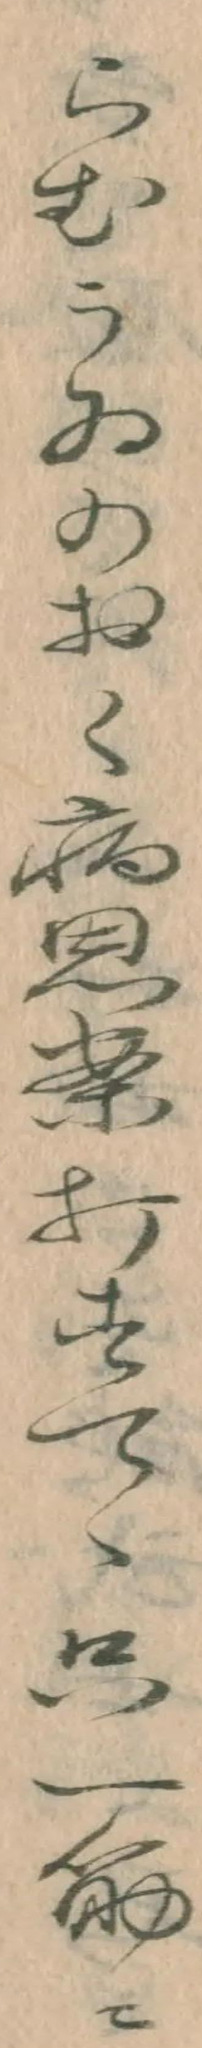一らむうゐのおく病思案打春てゝ只一筋に
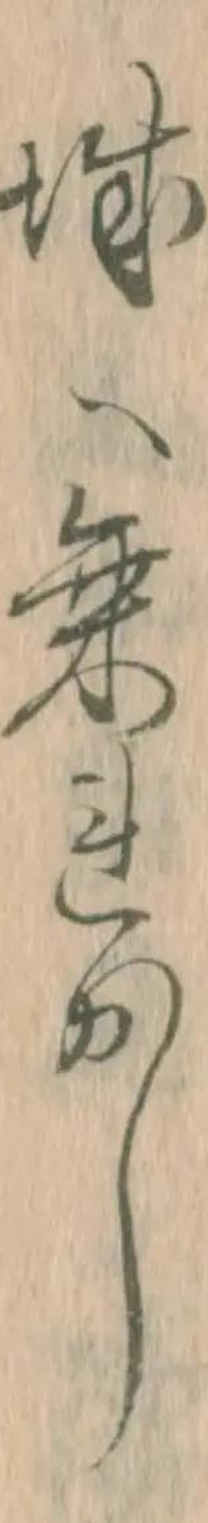城へ乗連かし
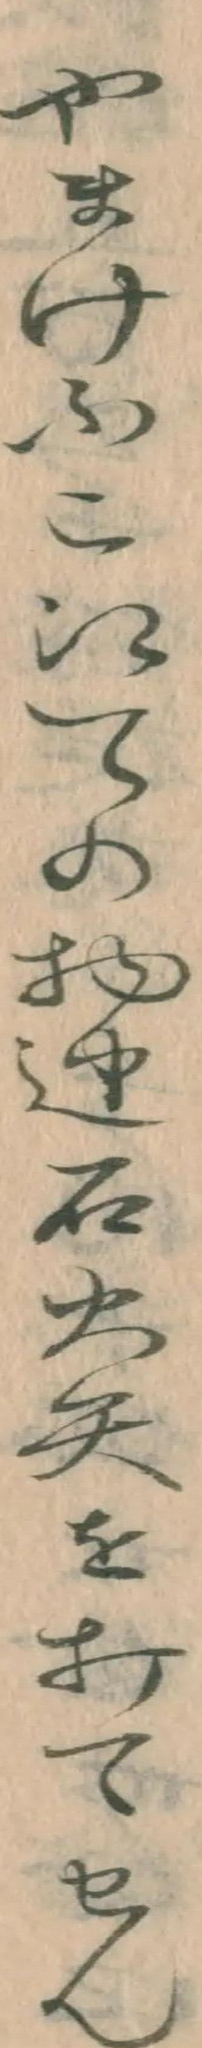一やまけふこ江ての物迚石火矢を打てせん
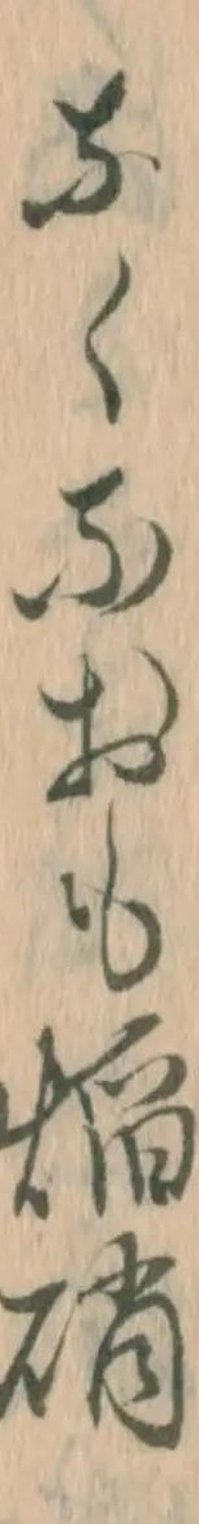なくなおも焔哨
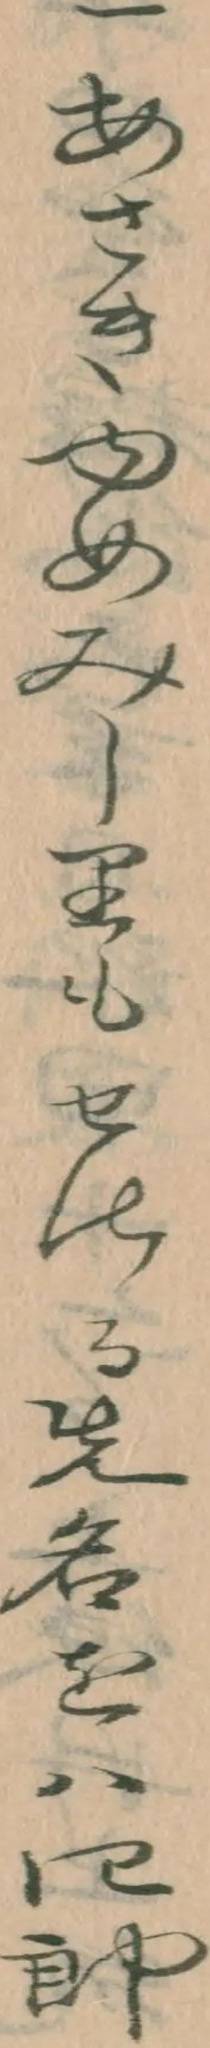一あさきゆめみし里もせさる先名をは四郎
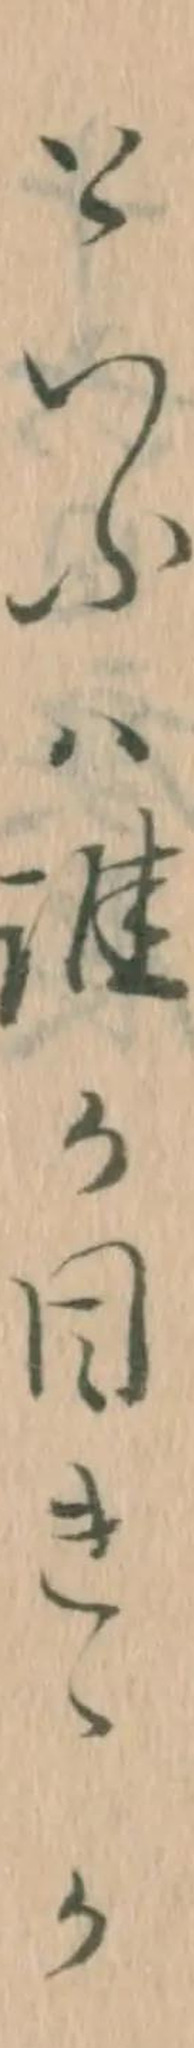といふは誰か目きゝか
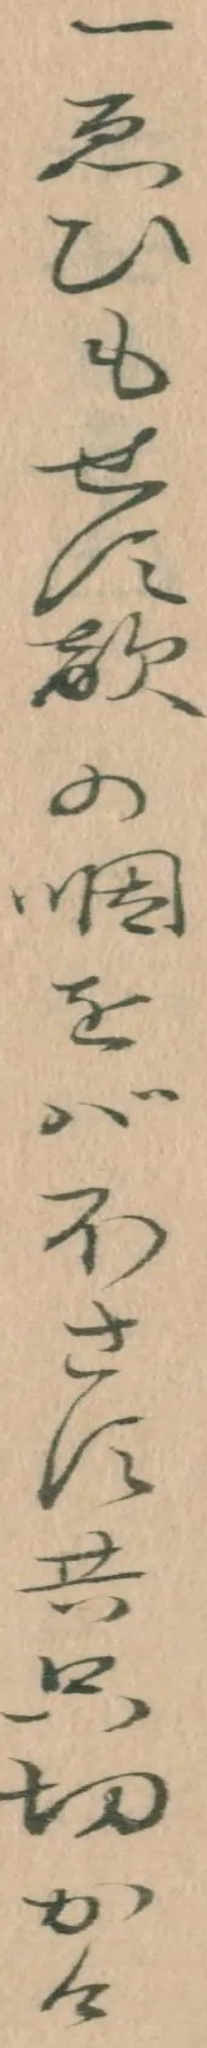一ゑひもせ須敵の咽をば不さ須共只切かけ
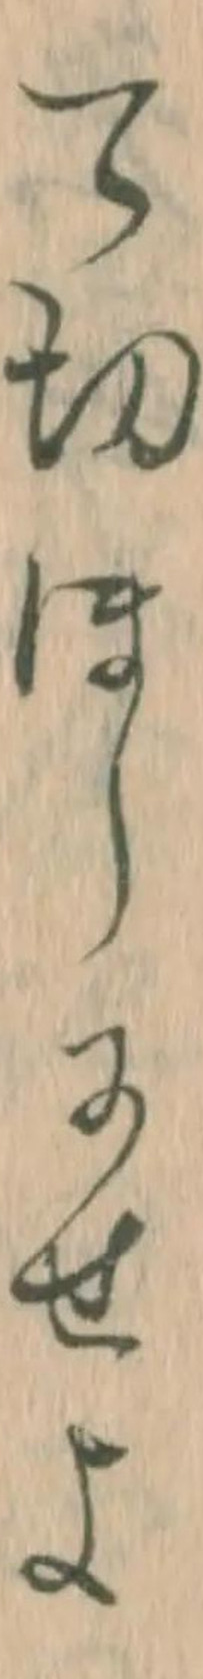て切ほし尓せよ
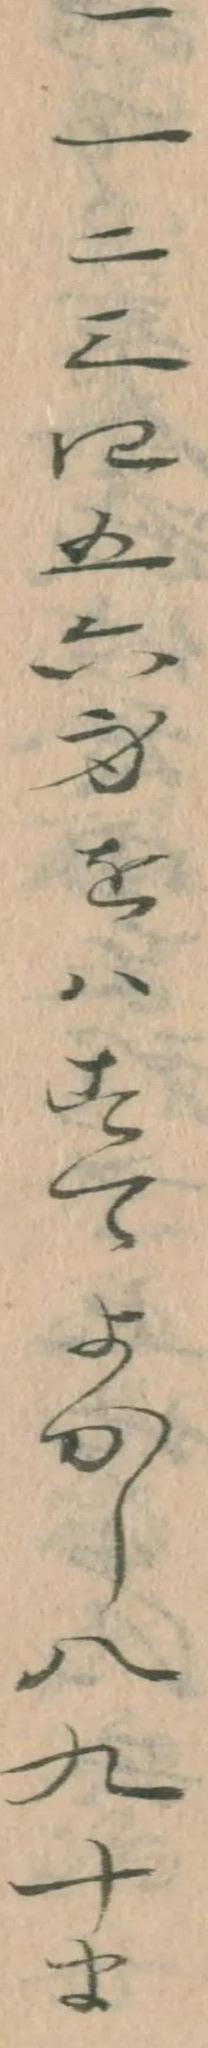一一二三四五六身をは春てよかし八九十ま
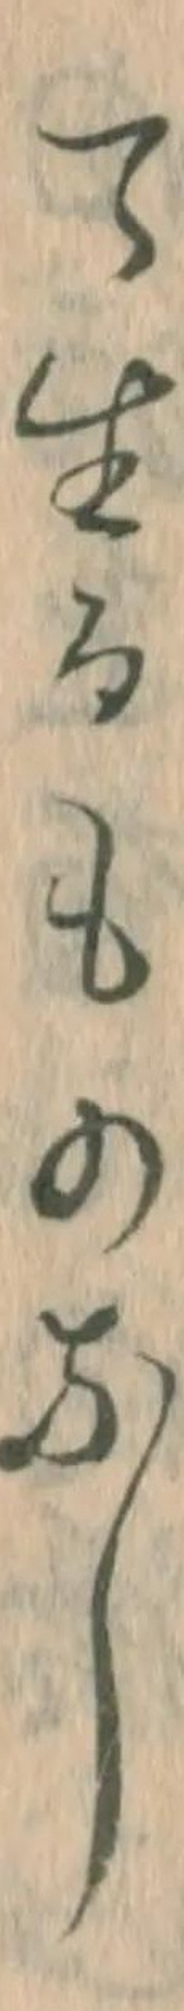て生るものなし
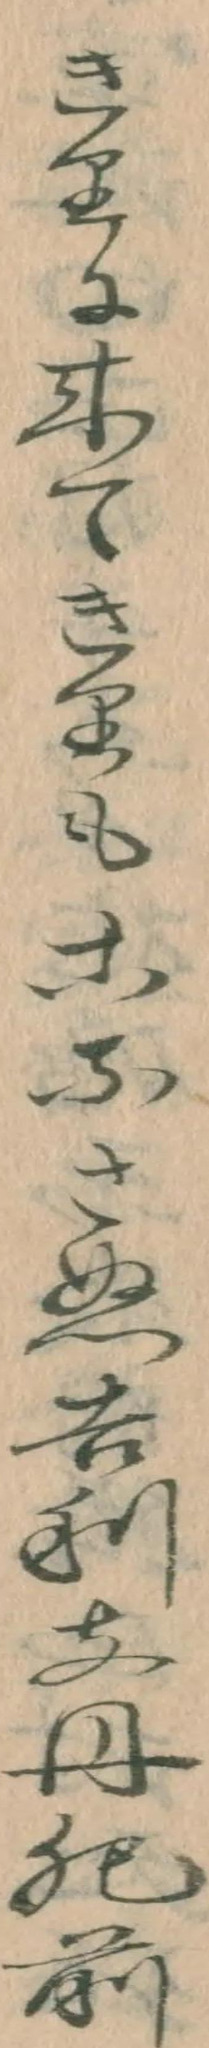一き里尓来てき里も古なさ怒吉利支丹肥前
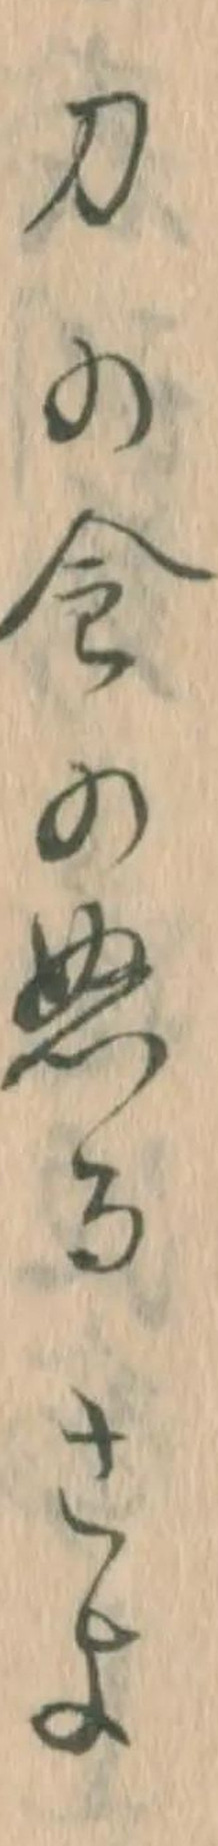刀の金の怒るさよ
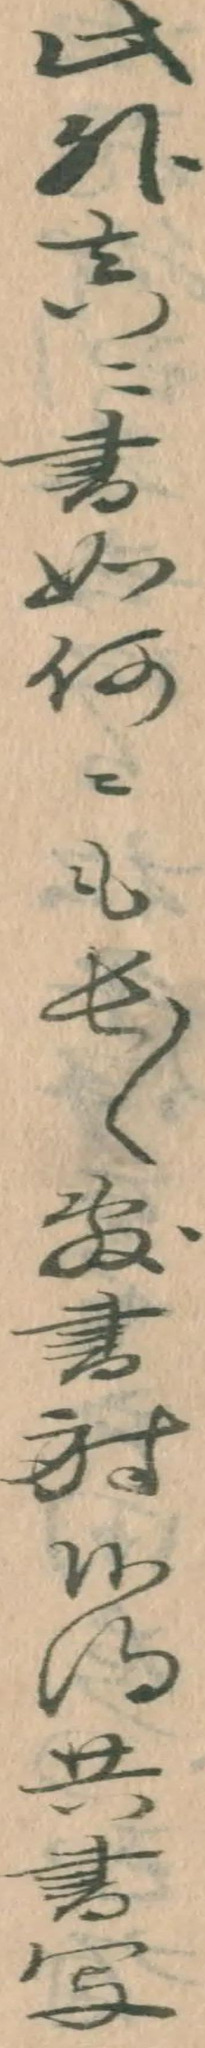此外真に書如何にも長々處書射候得共書写

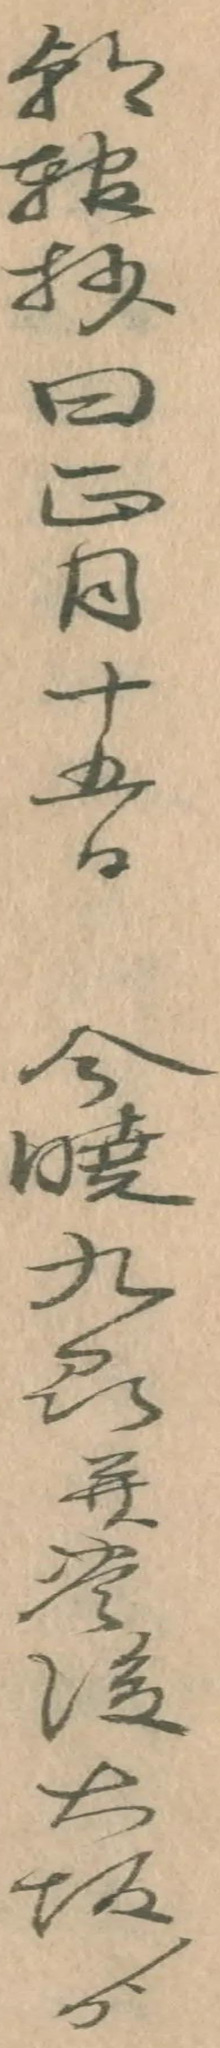朝報抄曰正月十五日今暁九州幷豊後大坂ゟ
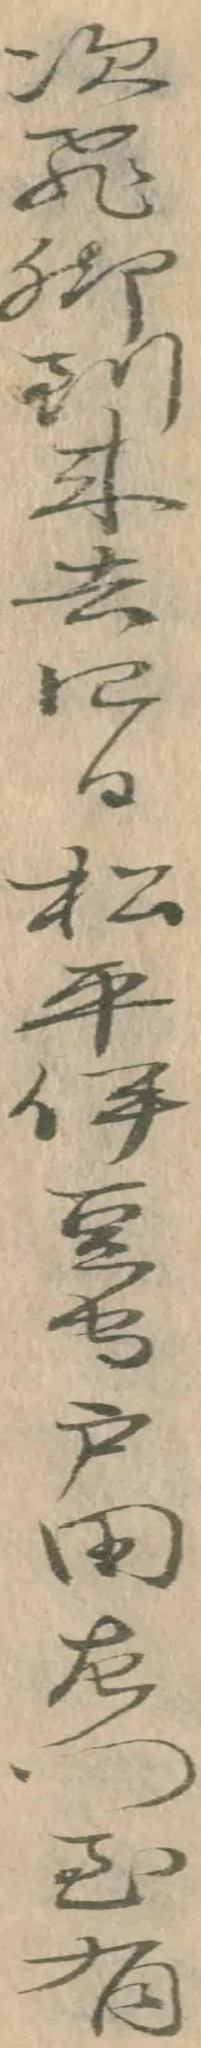次飛脚到来去四日松平伊豆守戸田左門至有
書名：切支丹御退治記 49巻. [6]
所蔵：国立国会図書館 National Diet Library, JAPAN
